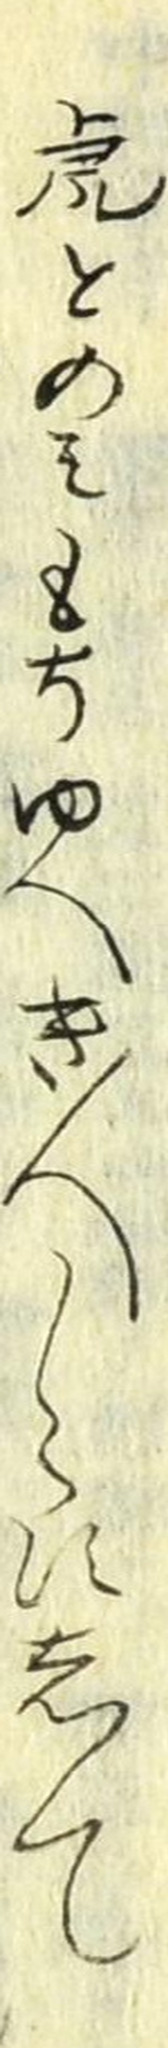虎とのみもちゆへき人しらすして
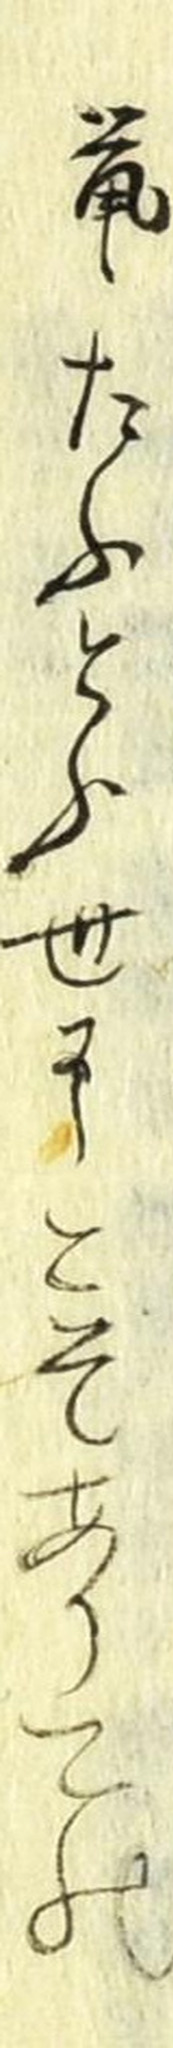鼠たふとふ世にこそありけれ
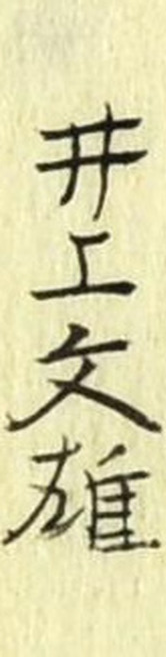井上文雄
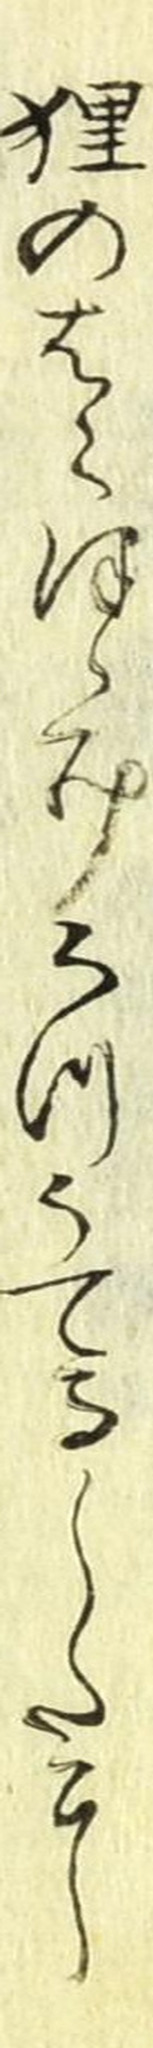狸のはらつゝみうつうてるしたに
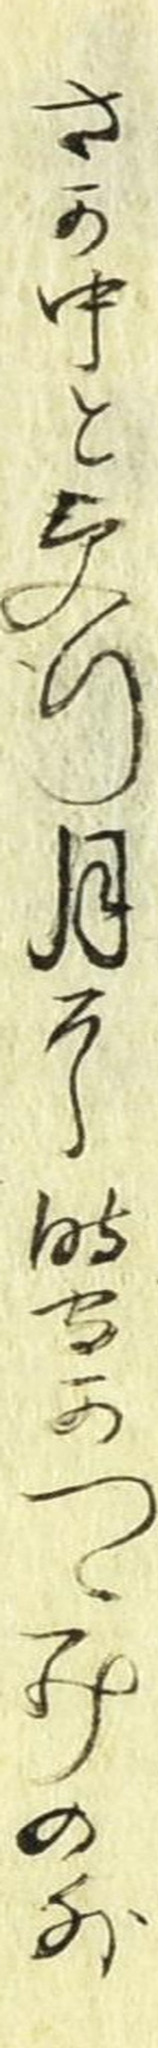さよ中と更行月に時守かつゝみの外
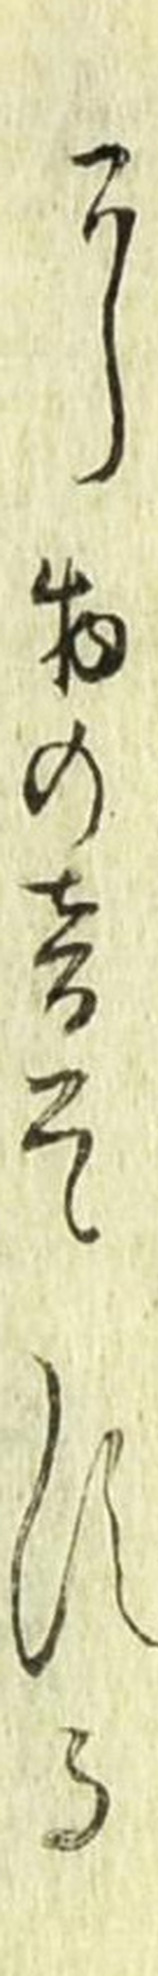に物の音そする

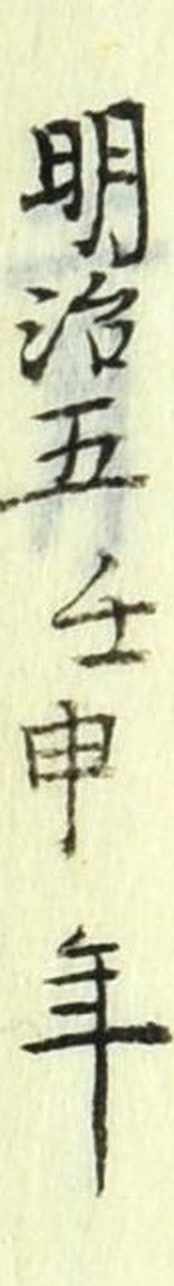明治五壬申年
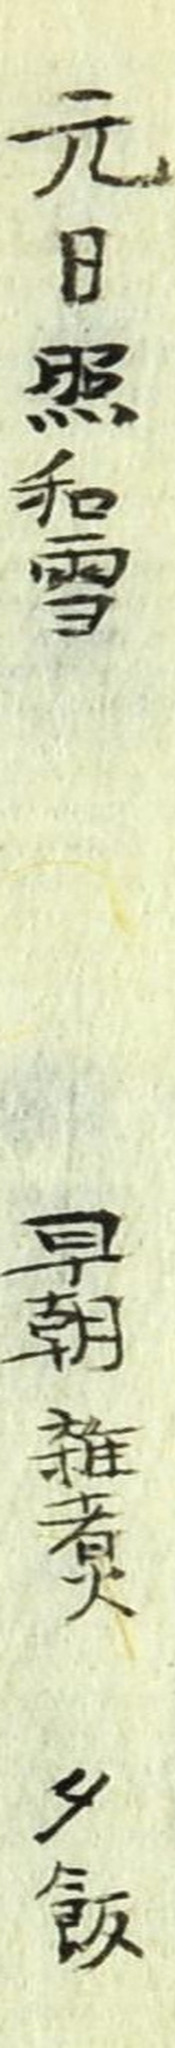元日照和雪早朝雑煮夕飯
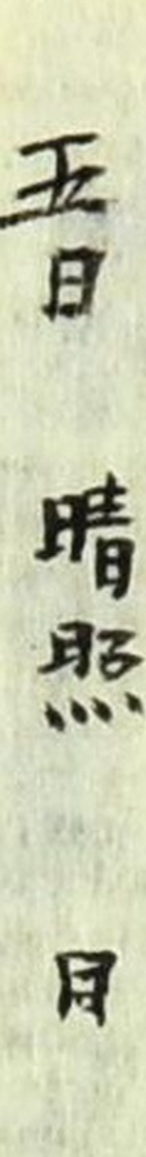五日晴照同
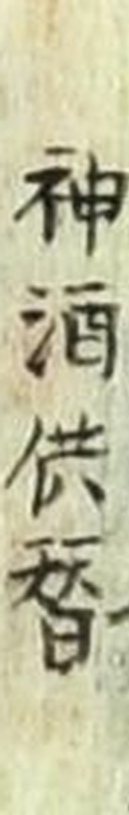神酒供替
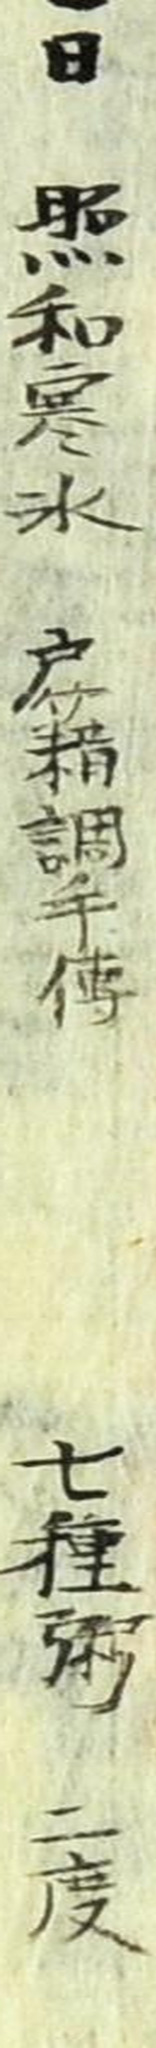七日照和寒氷戸籍調手伝七種粥二度
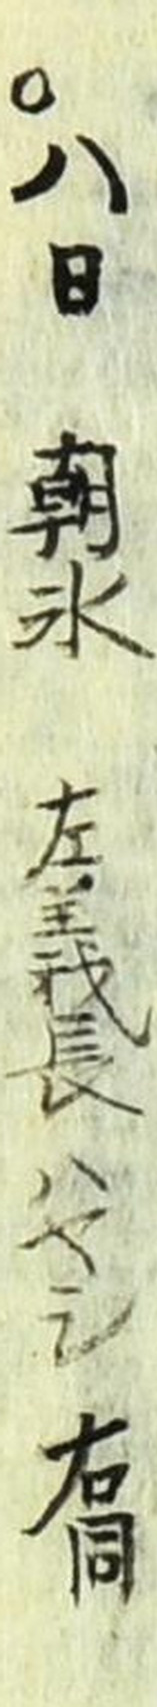○八日朝氷左義長ハヤシ右同
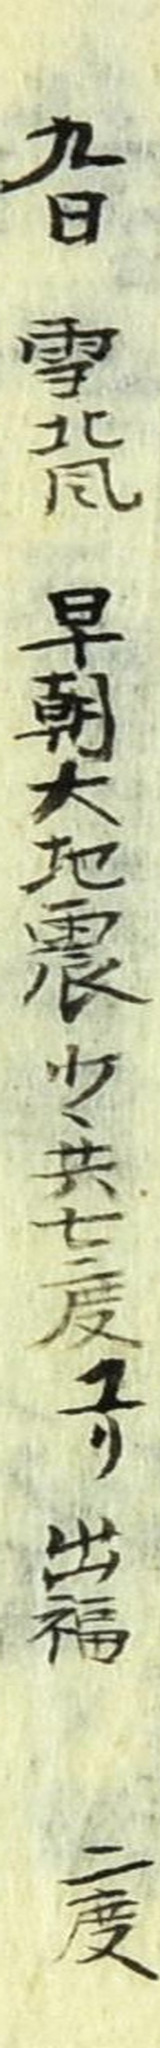九日雪北風早朝大地震少々共七度ユリ出福二度
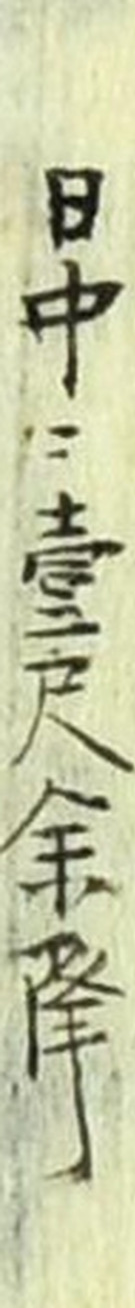日中ニ壱尺余降
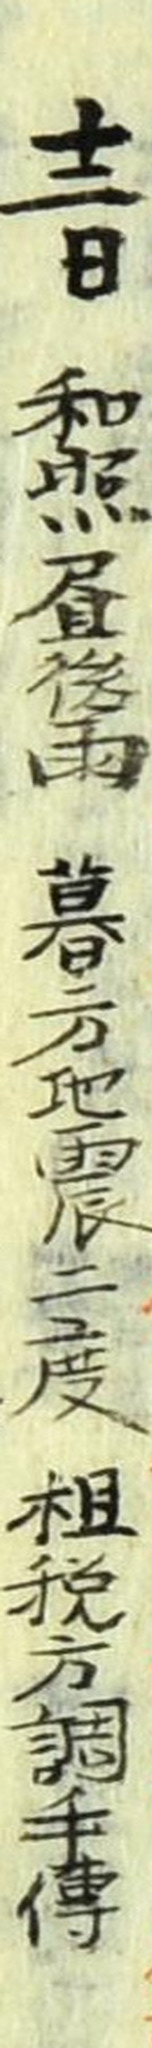十二日和照昼後雨暮方地震二度租税方調手伝
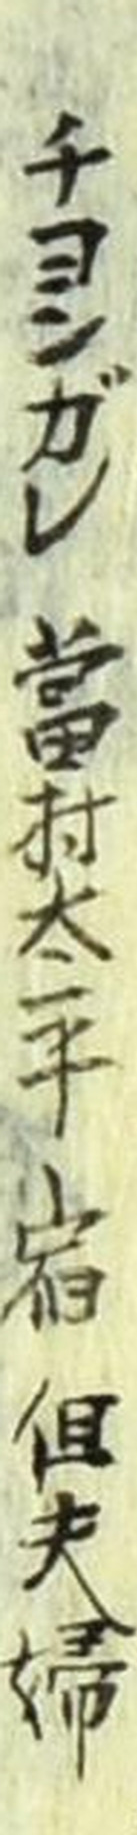チヨンガレ当村太平宿但夫婦
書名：（日記）
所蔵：福井県文書館 Fukui Prefectural Archives
